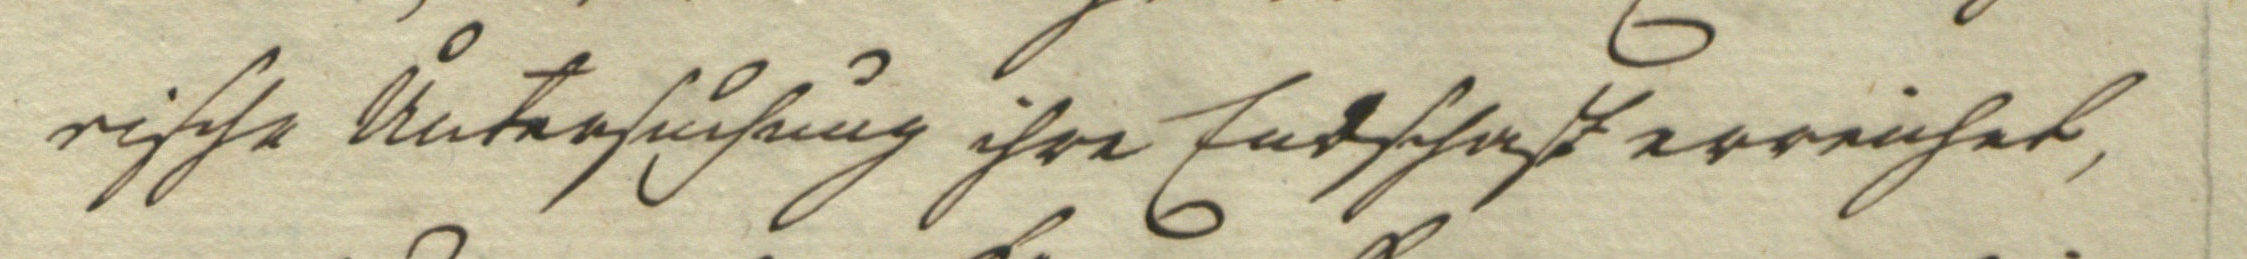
rische Untersuchung ihre Endschaft erreichet,
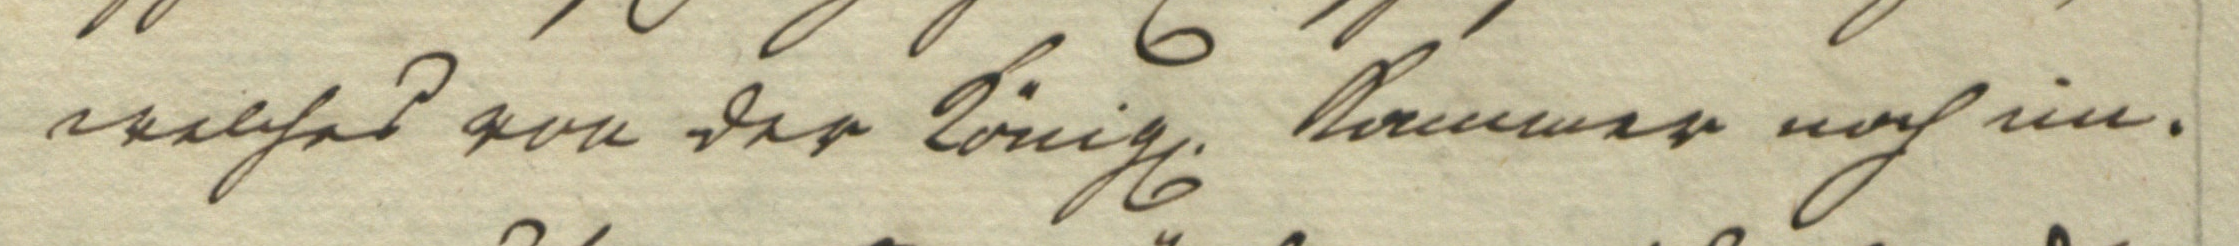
welches von der Königl. Kammer noch im¬
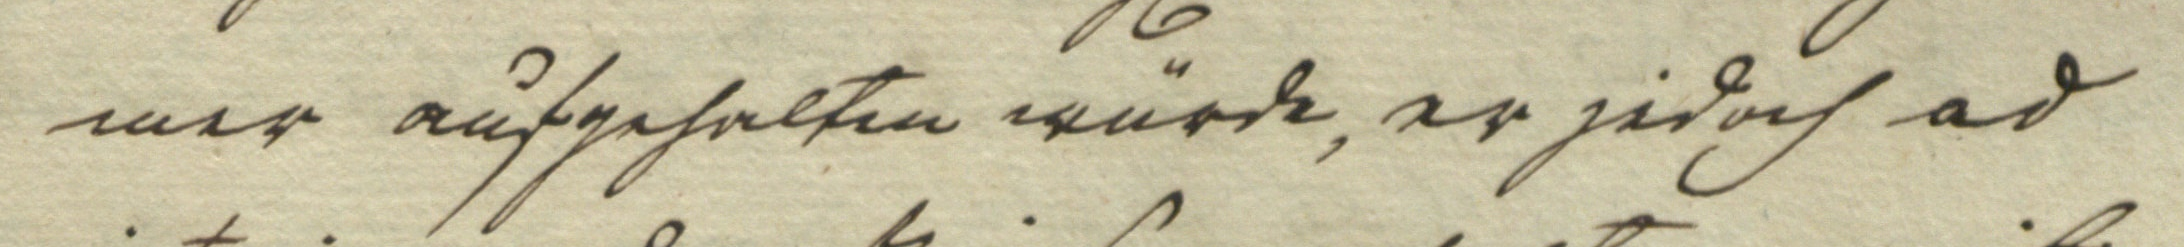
mer aufgehalten würde, er jedoch ad
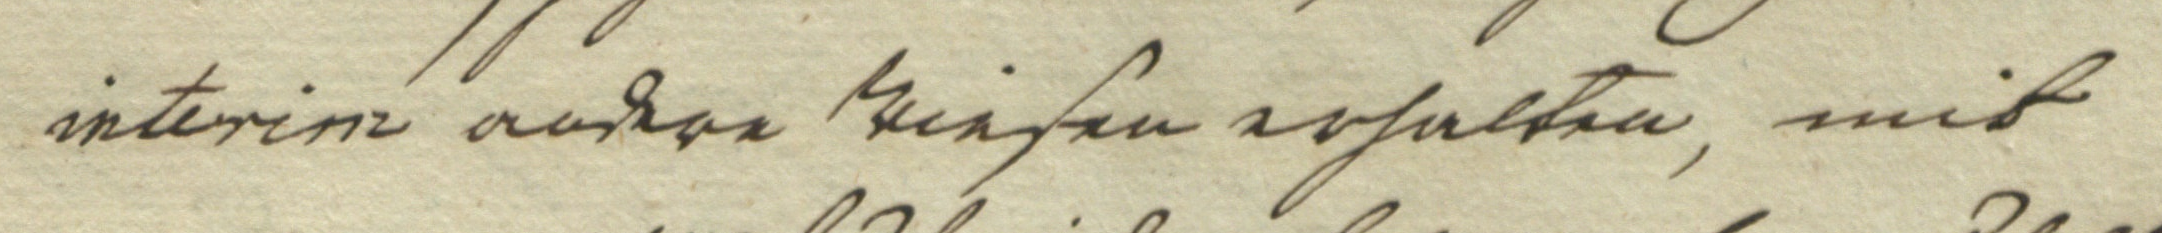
interim andere Wiesen erhalten, mit
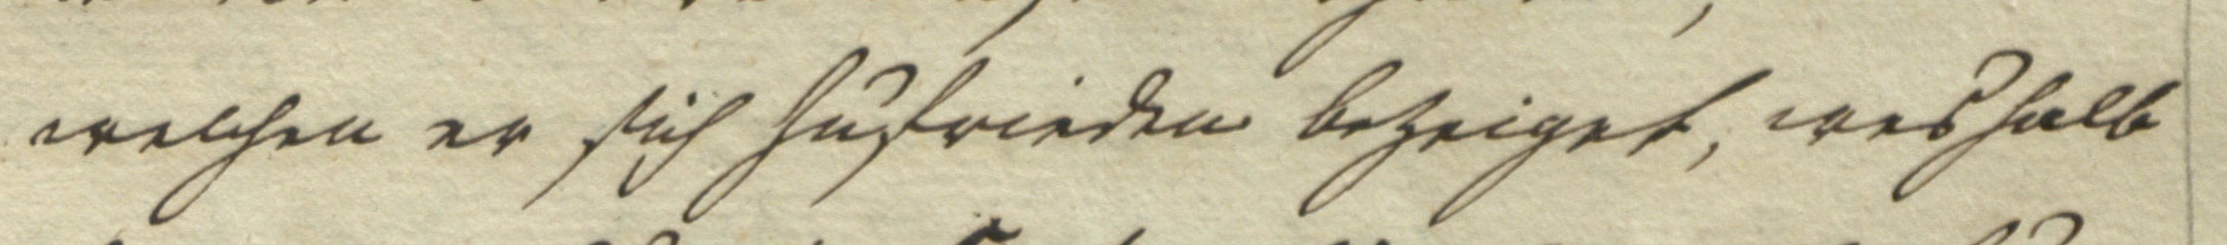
welchen er sich zufrieden bezeiget, weshalb
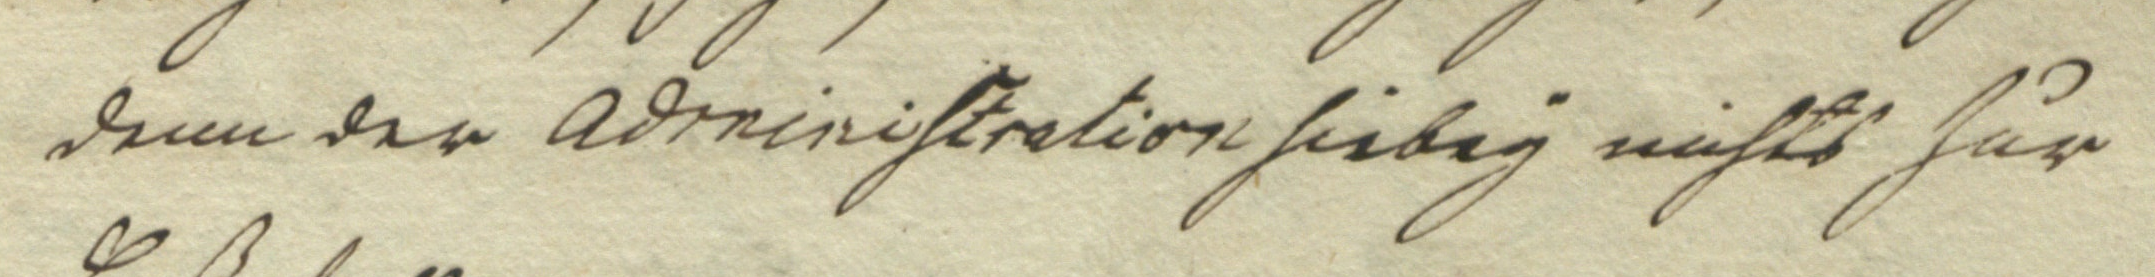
denn der Administration hiebeÿ nichts zur
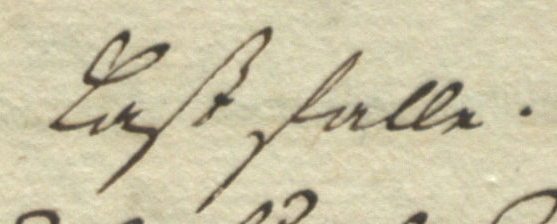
Last falle.
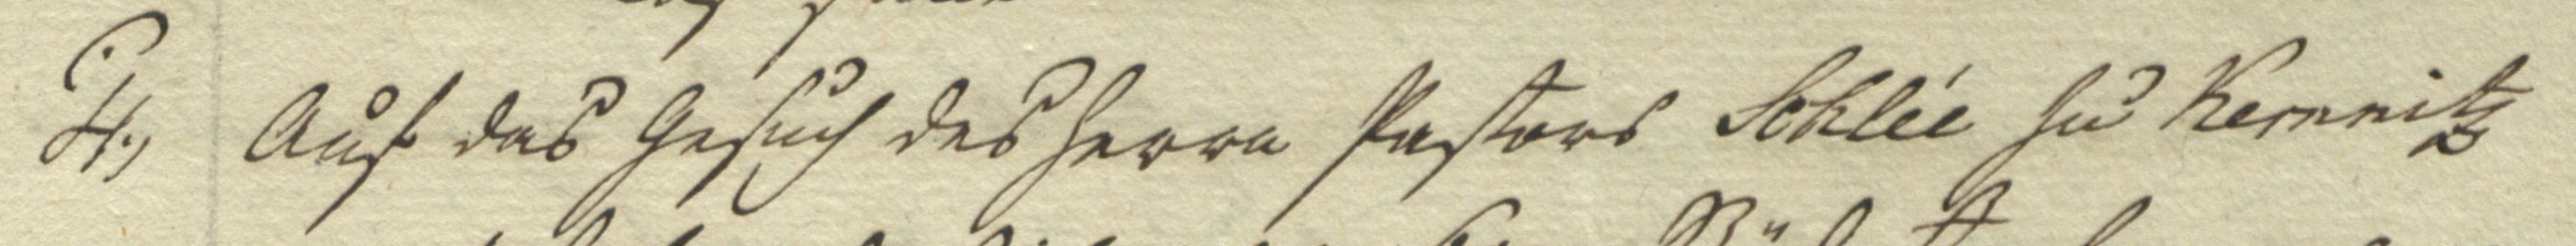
4., Auf des Gesuch des Herrn Pastors Schlée zu Kemnitz
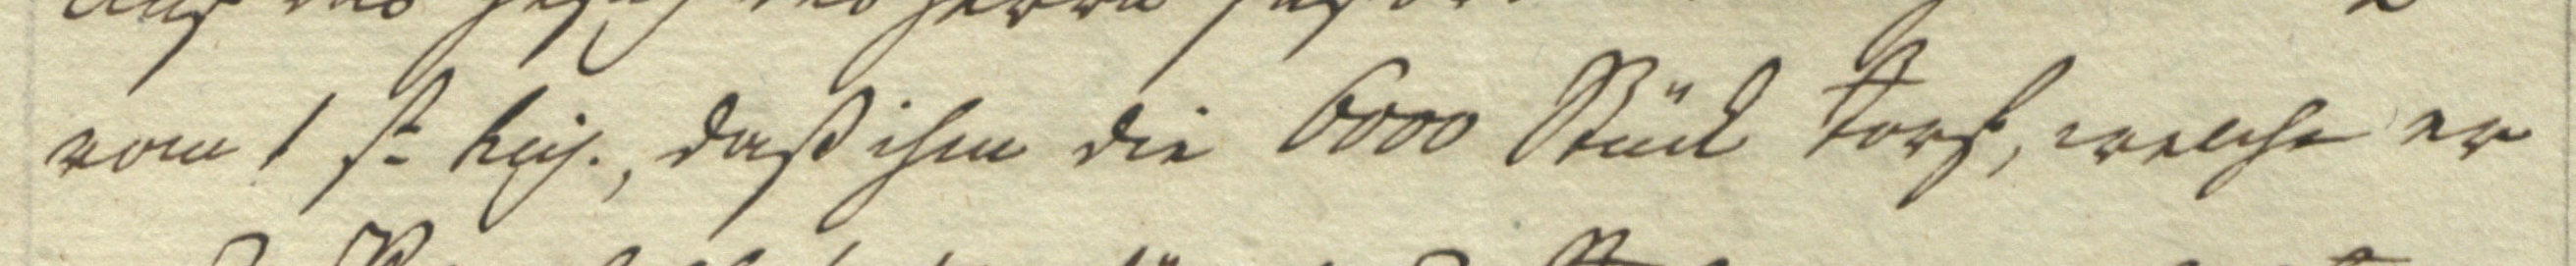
vom 1 st. huj. daß ihm die 6000 Stück Torf, welche er
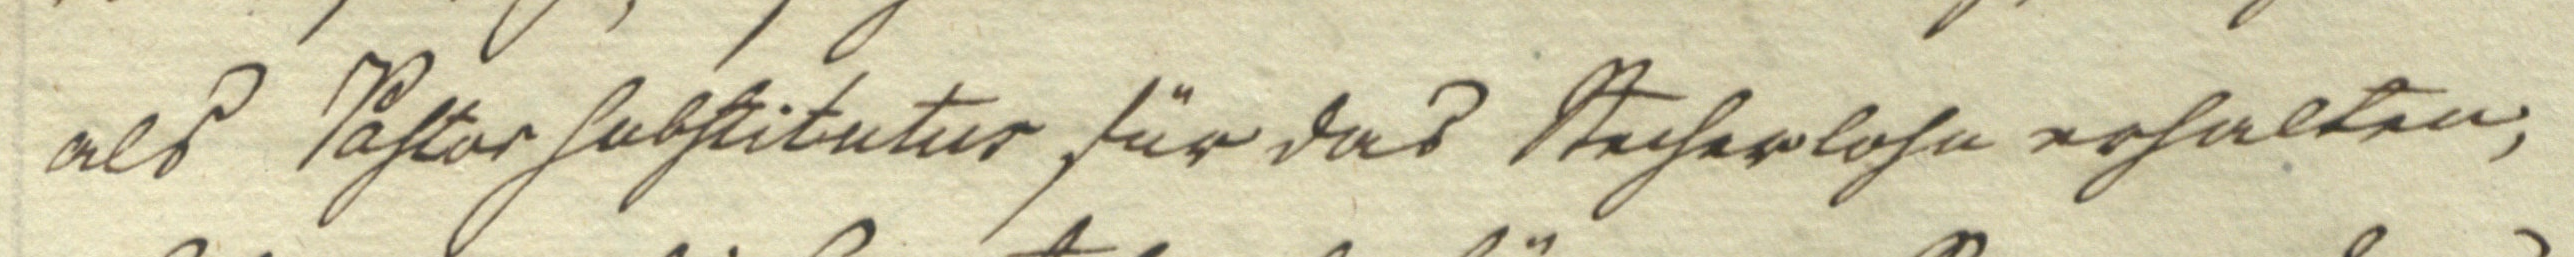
als Pastor substitutus für das Stecherlohn erhalten,
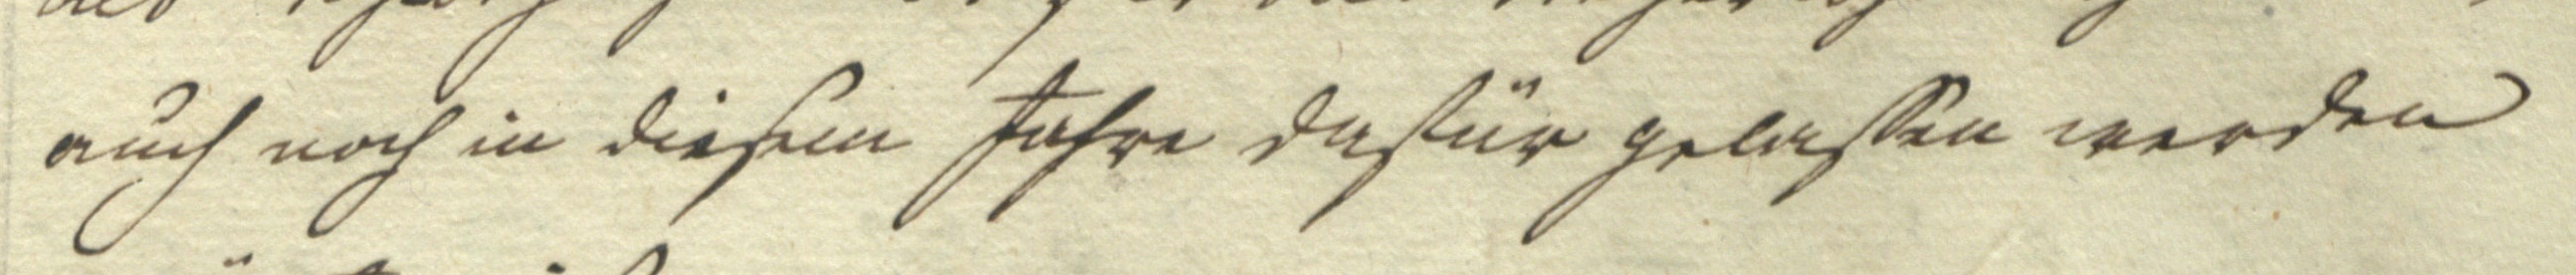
auch noch in diesem Jahre dafür gelassen werden
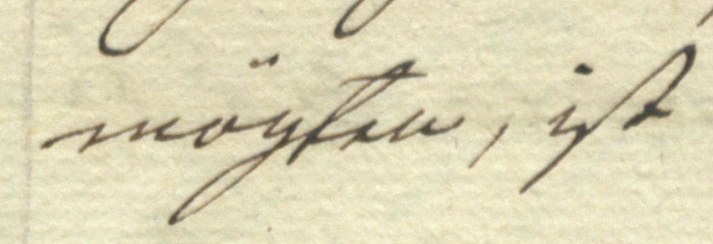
mögten, ist
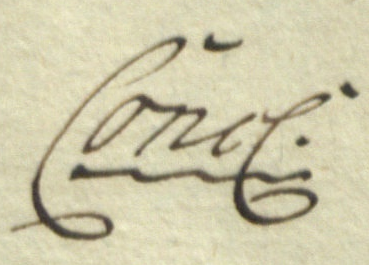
Concl.
